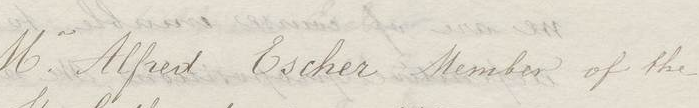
Mr Alfred Escher Member of the
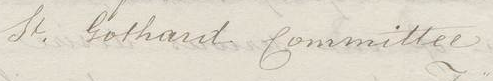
St. Gothard Committee
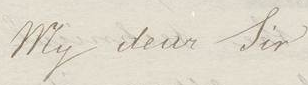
My dear Sir
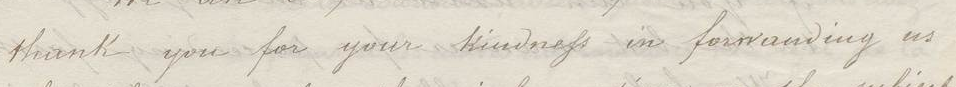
thank you for your kindness in forwarding us
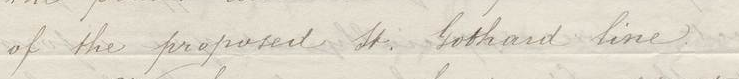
of the proposed St. Gothard line.
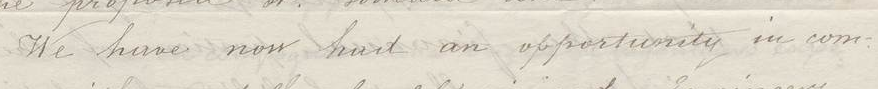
We have now had an opportunity in com-
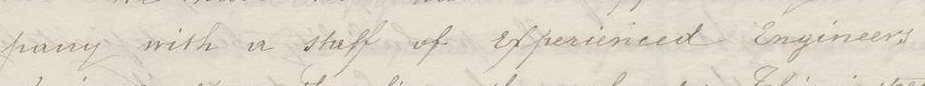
pany with a staff of experienced Engineers
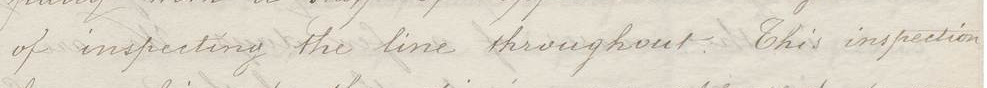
of inspecting the line throughout. This inspection
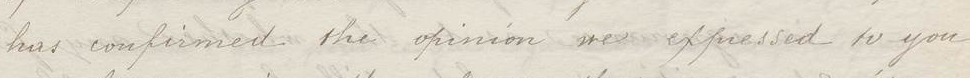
has confirmed the opinion we expressed to you
